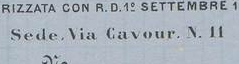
Sede, Via Cavour, N. 11
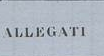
18 Novembe1871
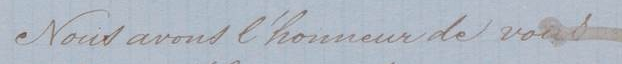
Nous avons l'honneur de vous
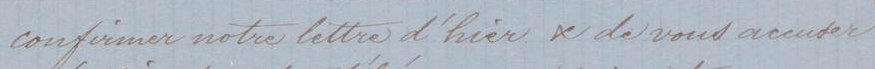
confirmer notre lettre d'hier & de vous accuser
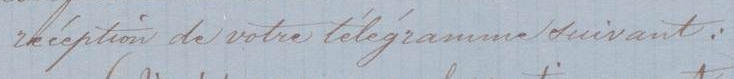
réception de votre télégramme suivant:
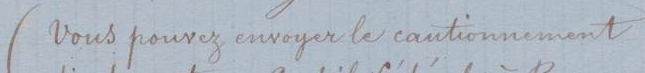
(Vous pouvez envoyer la cautionnement
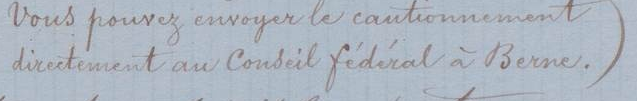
directement au Conseil fédéral à Bern.)
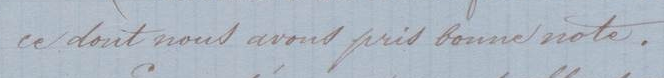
ce dont nous avons pris bonne note.
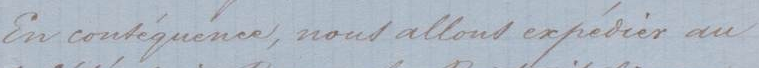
En conséquence, nous allons expédir au
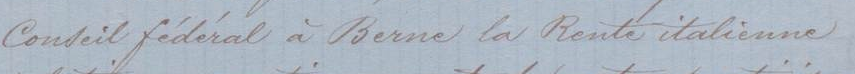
Conseil fédéral à Bern la Rente italienne
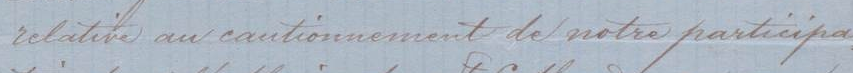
relative au cautionnement de notre participa-
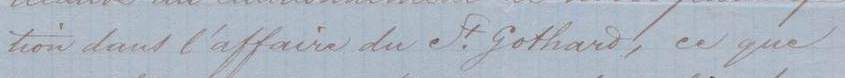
tion dans l'affaire du St Gothard, ce que
